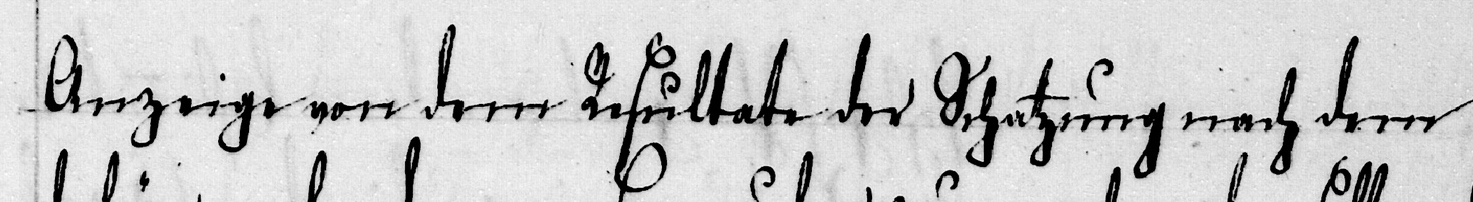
Anzeige von dem Resultate der Schatzung nach dem
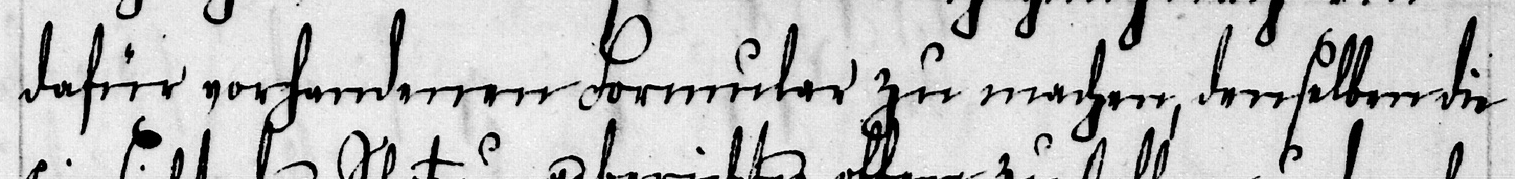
dafür vorhandenen Formular zu machen, denselben die
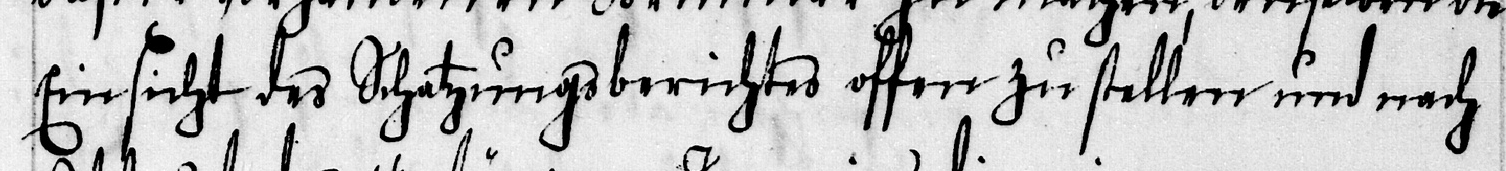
Einsicht des Schatzungsberichtes offen zu stellen und nach
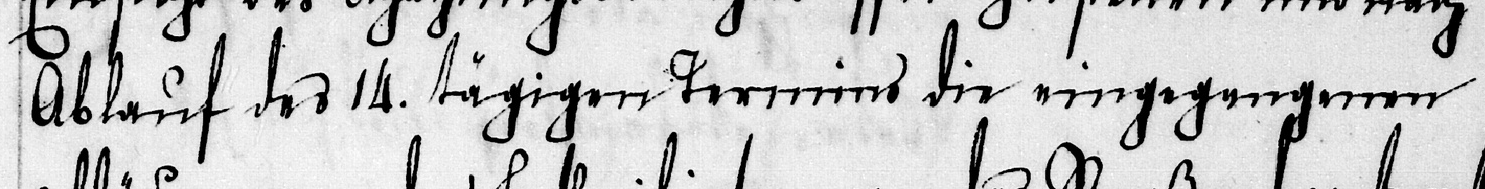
Ablauf des 14. tägigen Termins die eingegangenen
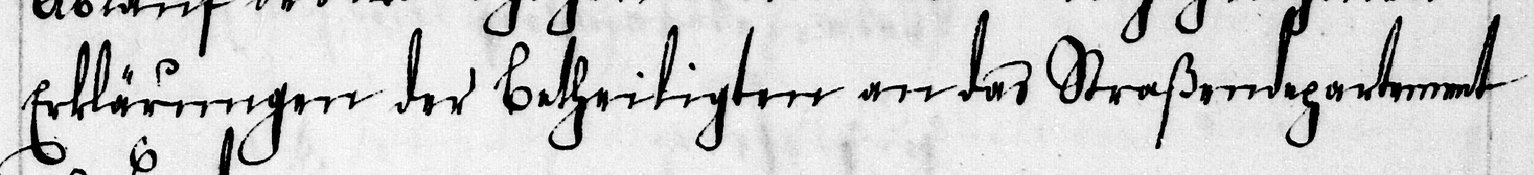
Erklärungen der Betheiligten an das Straßendepartement
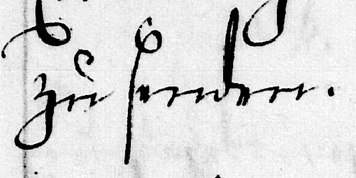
zu senden.
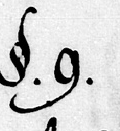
§. 9.
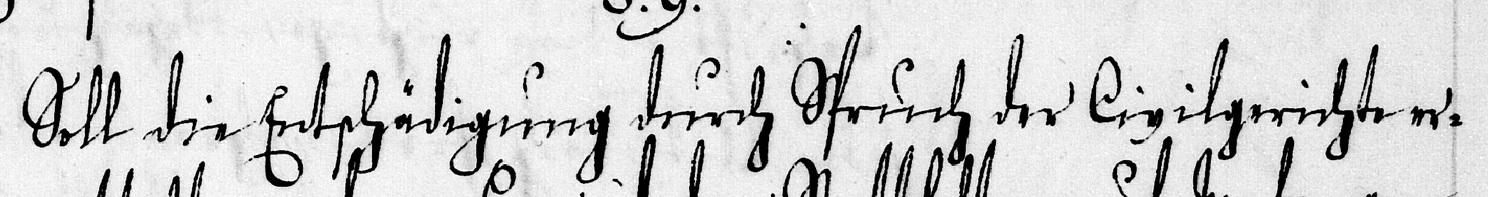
Soll die Entschädigung durch Spruch der Civilgerichte er¬
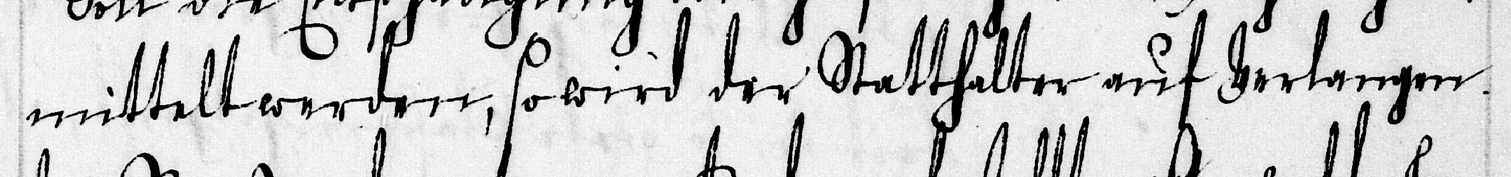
mittelt werden, so wird der Statthalter auf Verlangen
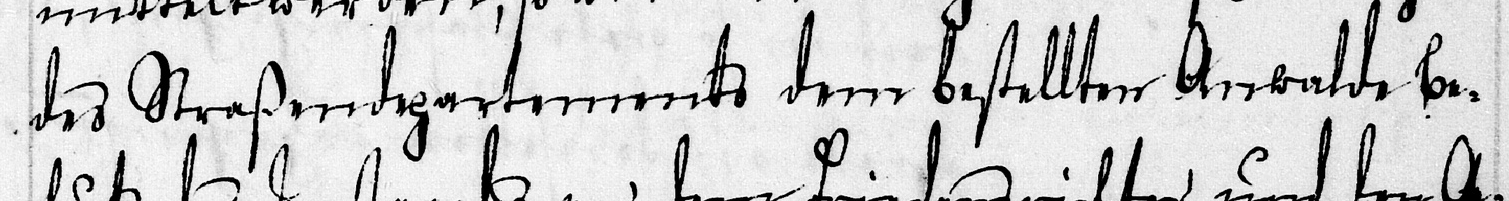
des Straßendepartements dem bestellten Anwalde Be¬
